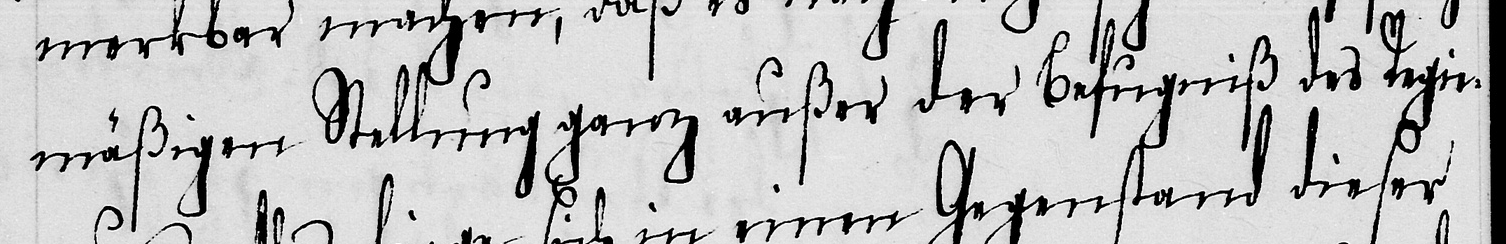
mäßigen Stellung ganz außer der Befugniß des Regie¬
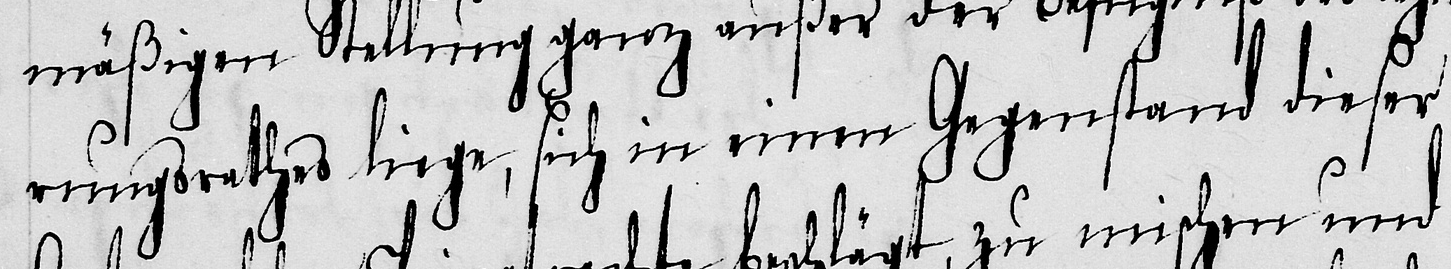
rungsrathes liege, sich in einen Gegenstand dieser
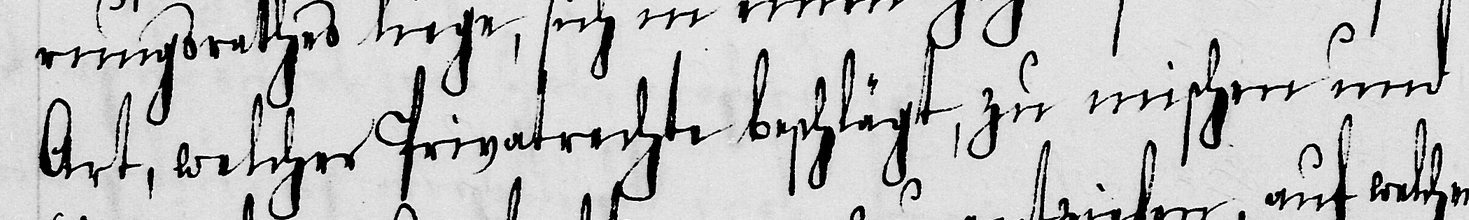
Art, welcher Privatrechte beschlägt, zu mischen und
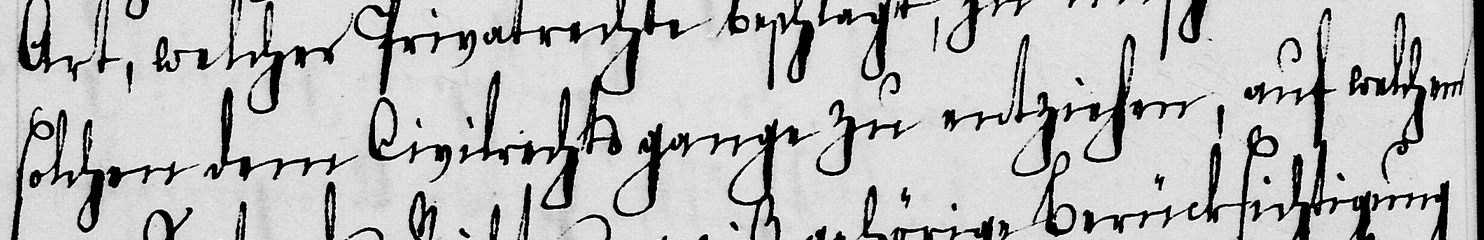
solchen dem Civilrechtsgange zu entziehen, auf welchem
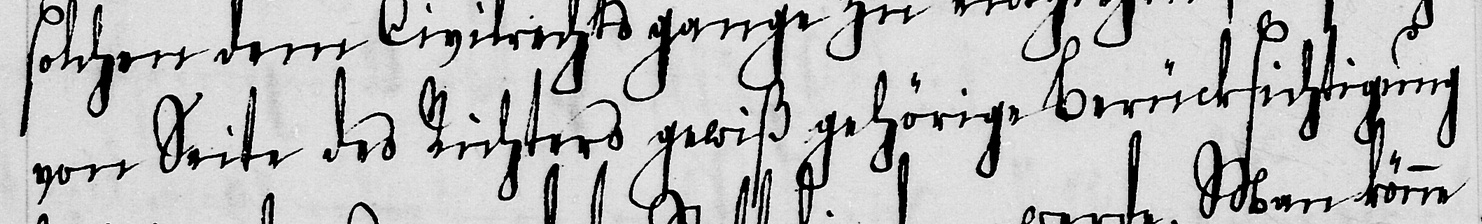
von Seite des Richters gewiß gehörige Berücksichtigung
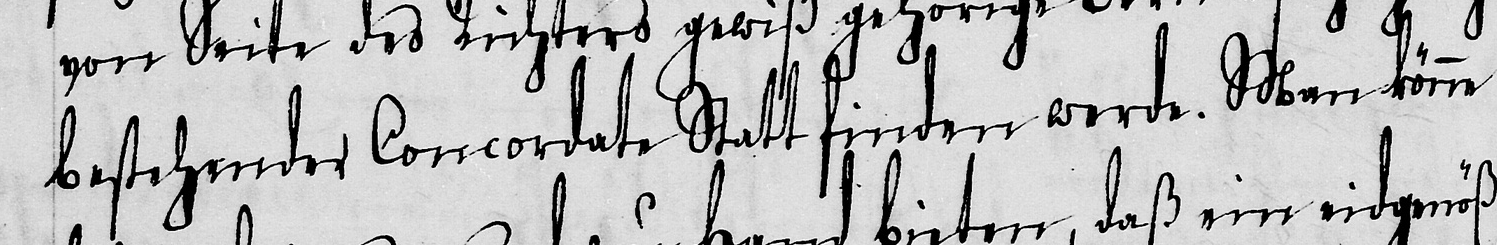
bestehender Concordate Statt finden werde. Man kön¬
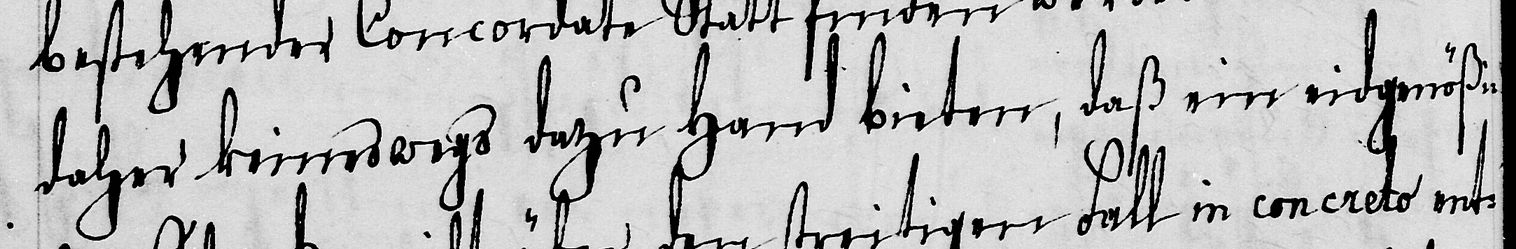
daher keineswegs dazu Hand bieten, daß ein eidgenößi¬
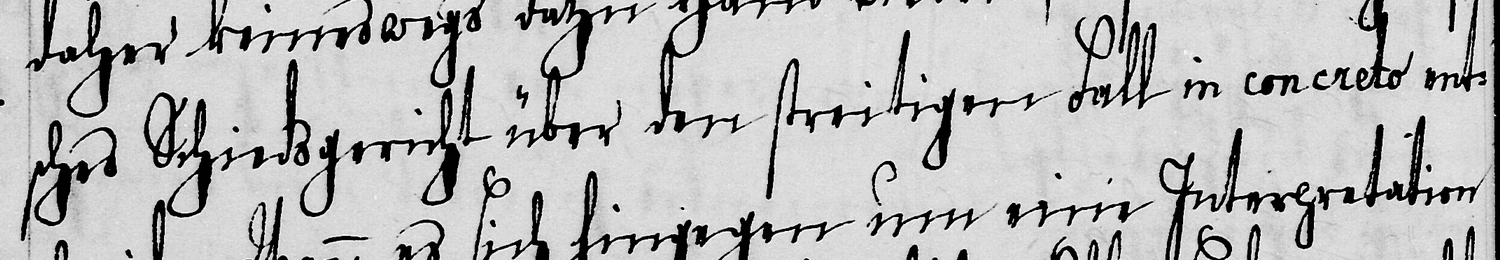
sches Schiedsgericht über den streitigen Fall in concreto ent¬
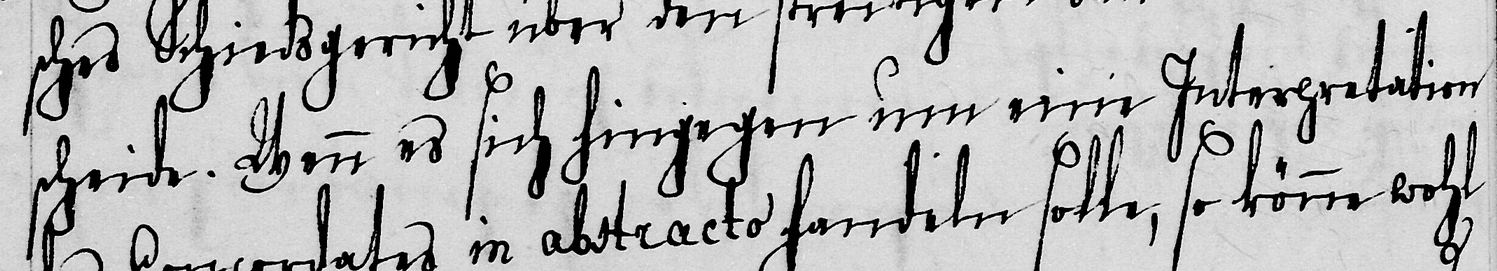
scheide. Wenn es sich hingegen um eine Interpretation
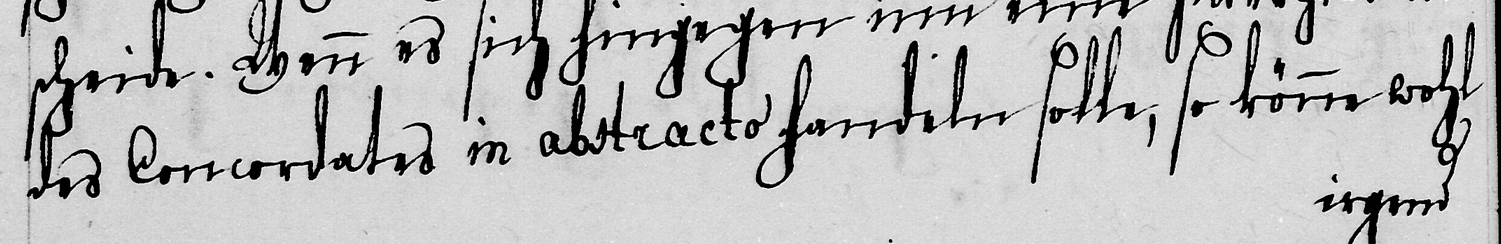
des Concordates in abstracto handeln solle, so könne wo¬
